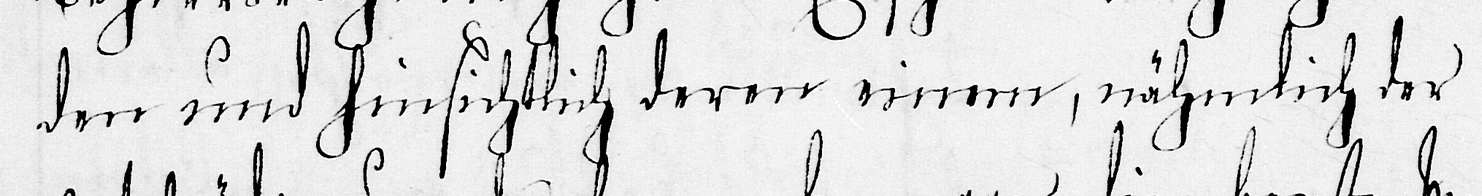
den und hinsichtlich deren einem, nähmlich der
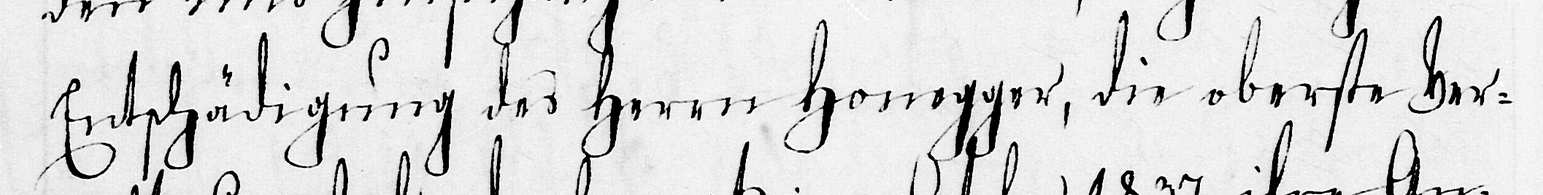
Entschädigung des Herrn Honegger, die oberste Ver¬
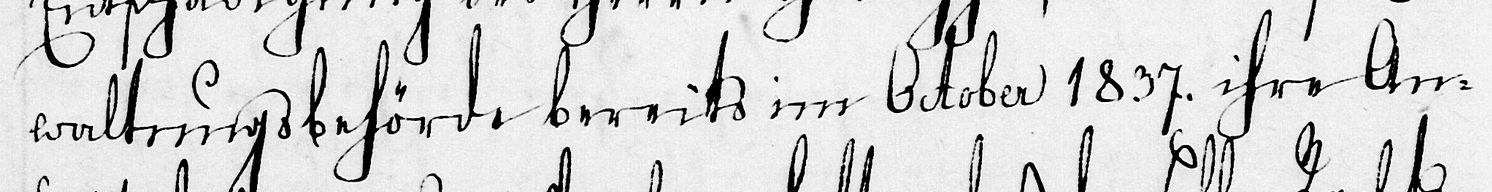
waltungsbehörde bereits im October 1837. ihre An¬
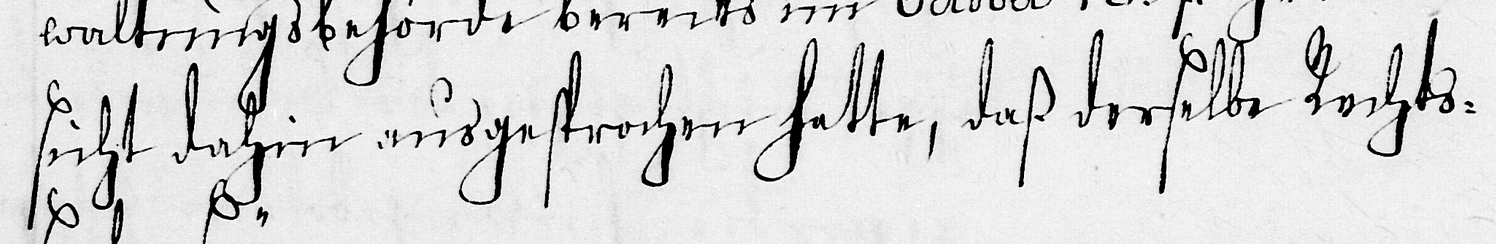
sicht dahin ausgesprochen hatte, daß derselbe Rechts¬
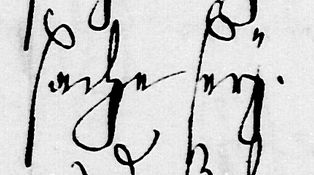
sache sey.
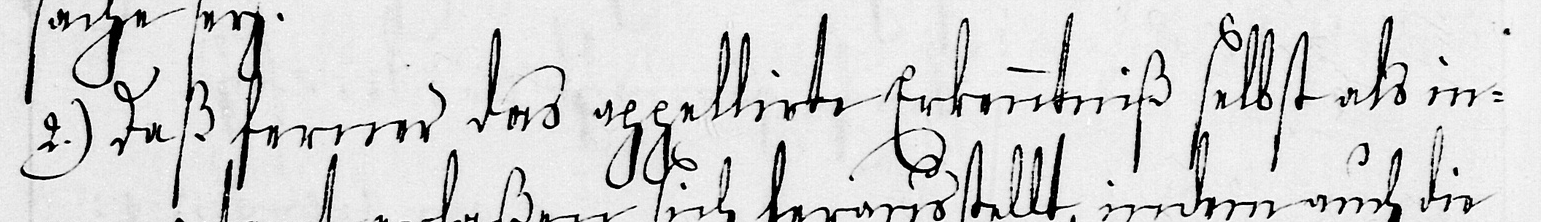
2.) Daß ferner das appellirte Erkenntniß selbst als in¬
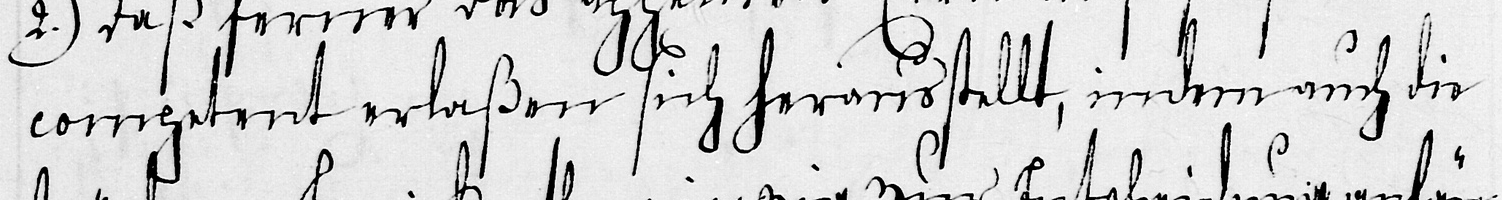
competent erlaßen sich herausstellt, indem auch die
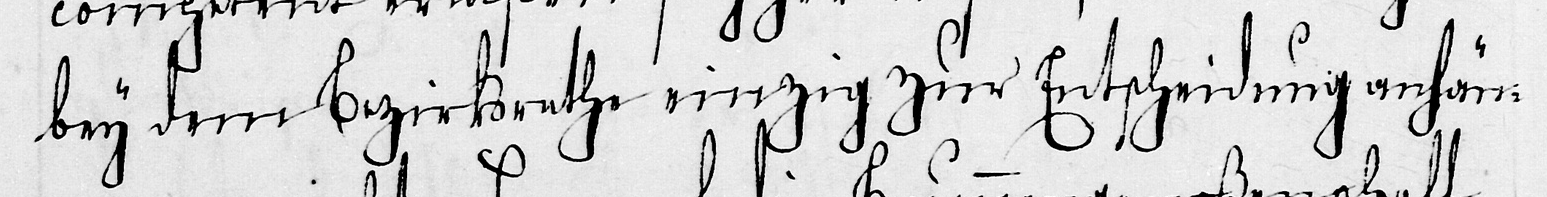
bey dem Bezirksrathe einzig zur Entscheidung anhän¬
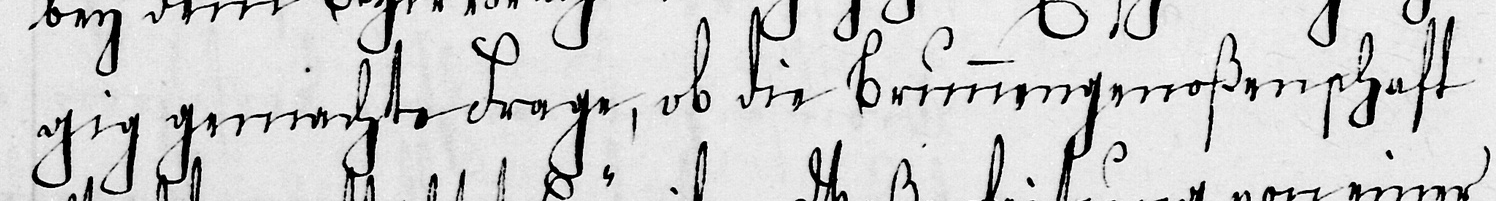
gig gemachte Frage, ob die Brunnengenoßenschaft
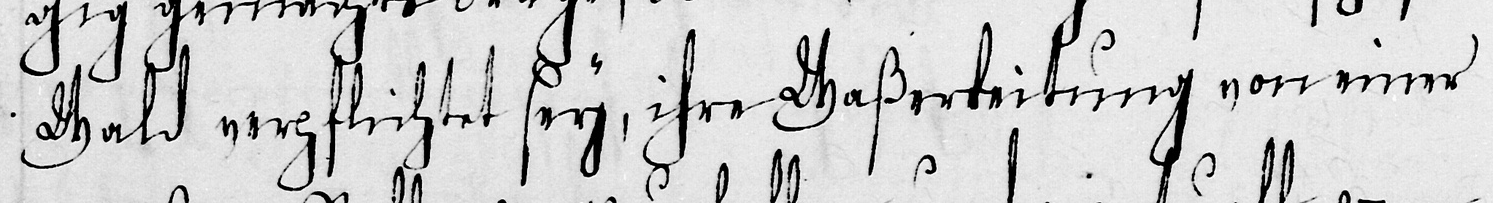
Wald verpflichtet sey, ihre Waßerleitung von einer
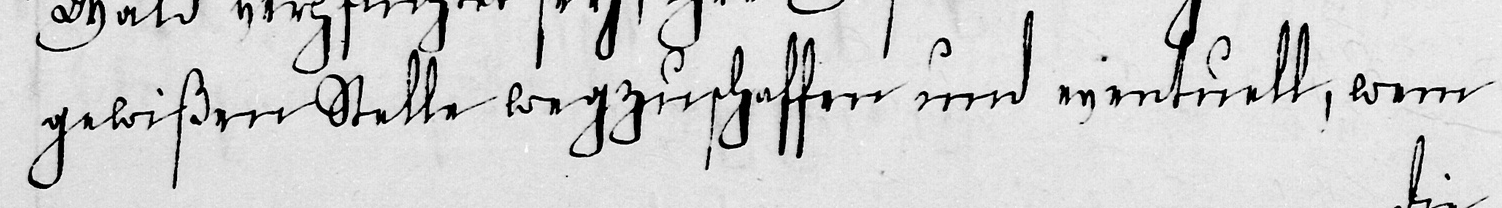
gewißen Stelle wegzuschaffen und eventuell, wem
